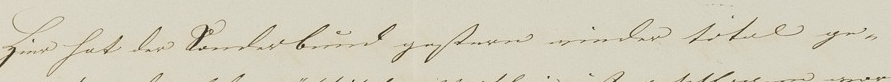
Hier hat der Sonderbund gestern wieder total ge-
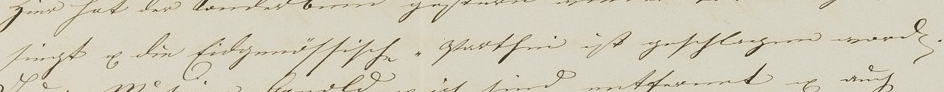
siegt & die Eidgenössische-Parthei ist geschlagen worden.
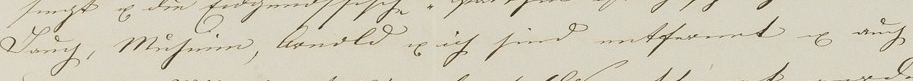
Jauch, Muheim, Arnold & ich sind entfernt & auch
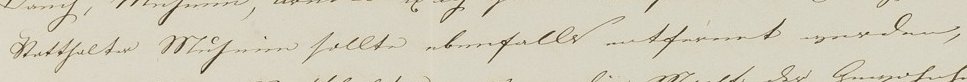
Statthalter Muheim sollte ebenfalls entfernet werden,
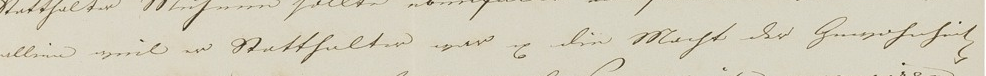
allein weil er Statthalter war & die Macht der Gewohnheiten
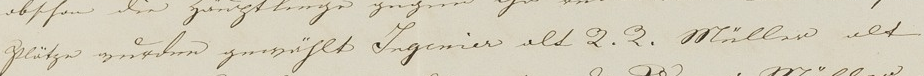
Plätze wurden gewählt Ingenier alt R.R. Müller alt
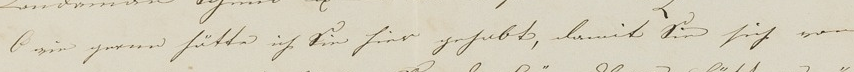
O wie gerne hätte ich Sie hier gehabt, damit Sie sich von
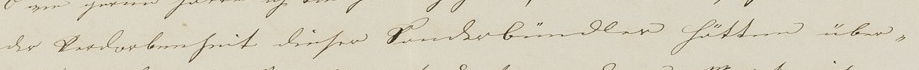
der Verdorbenheit dieser Sonderbündler hätten über-
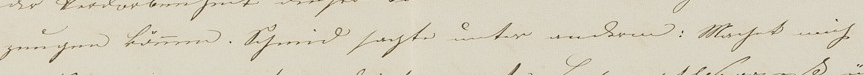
zeugen können. Schmid sagte unter anderm: Machet mich
